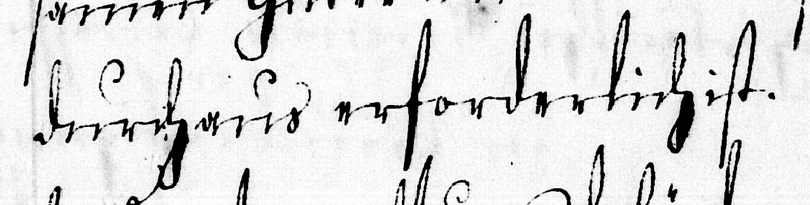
durchaus erforderlich ist.
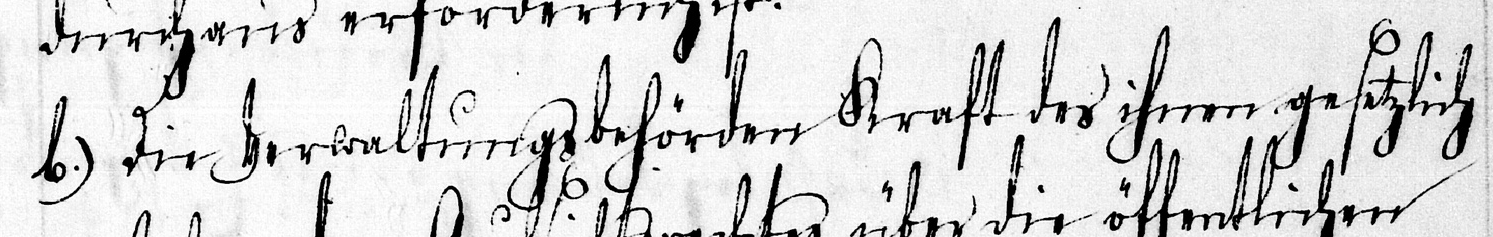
b.) Die Verwaltungsbehörden Kraft des ihnen gesetzli¬
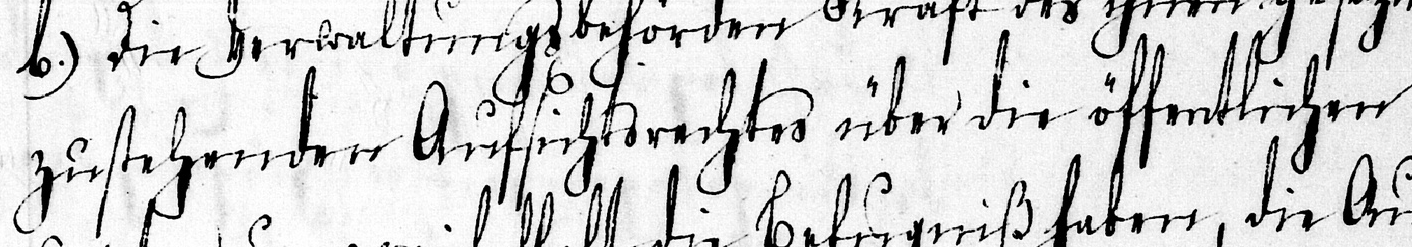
zustehenden Aufsichtsrechtes über die öffentlichen
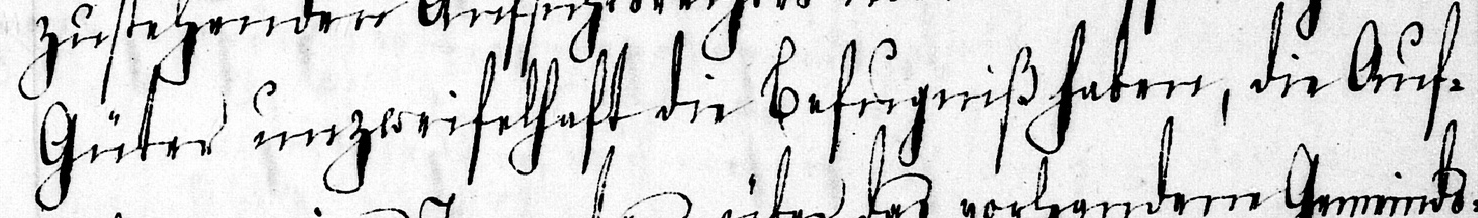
Güter unzweifelhaft die Befugniß haben, die Auf¬
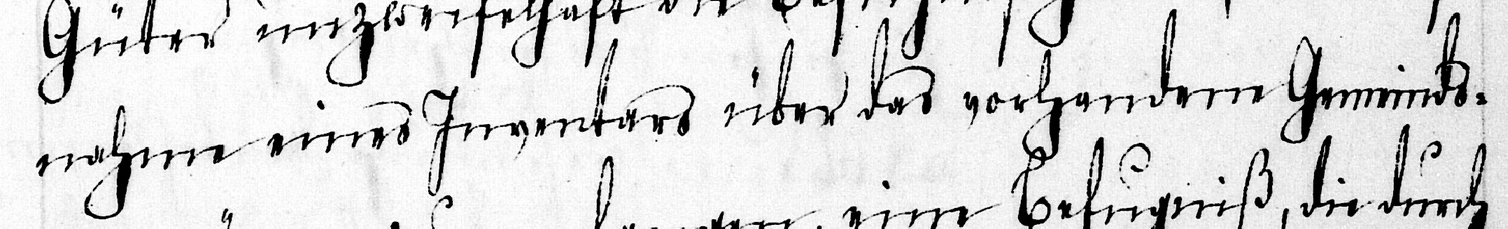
nahme eines Inventars über das vorhandene Gemeinds¬
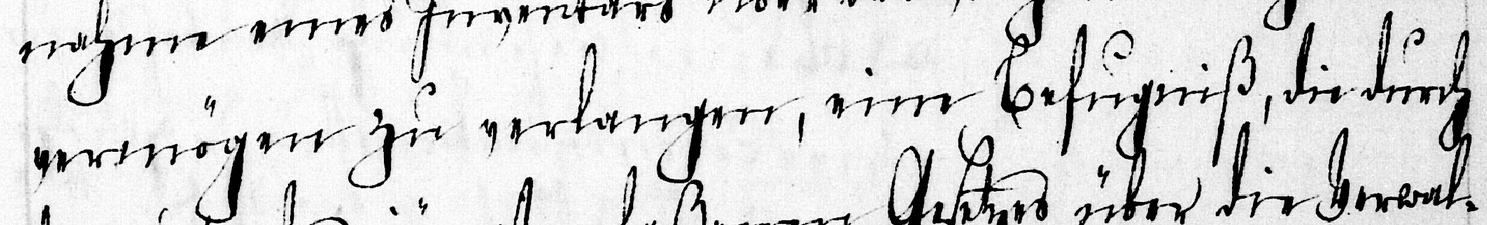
vermögen zu verlangen, eine Befugniß, die durch
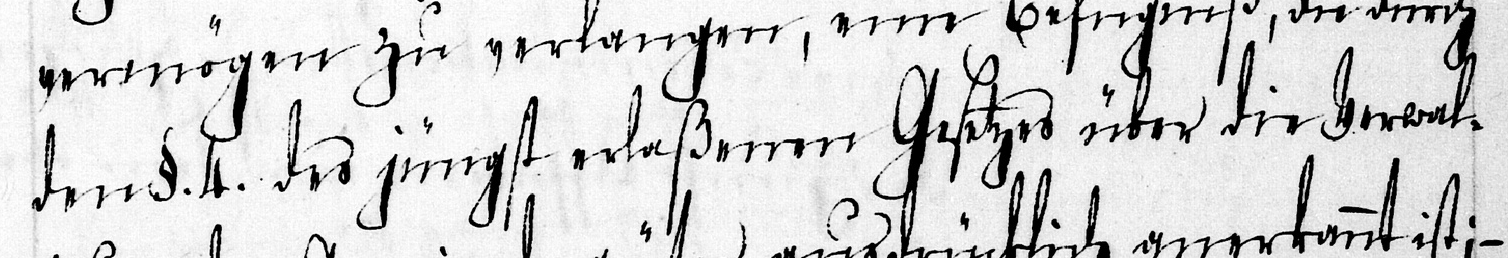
den §. 4. des jüngst erlaßenen Gesetzes über die Verwal¬
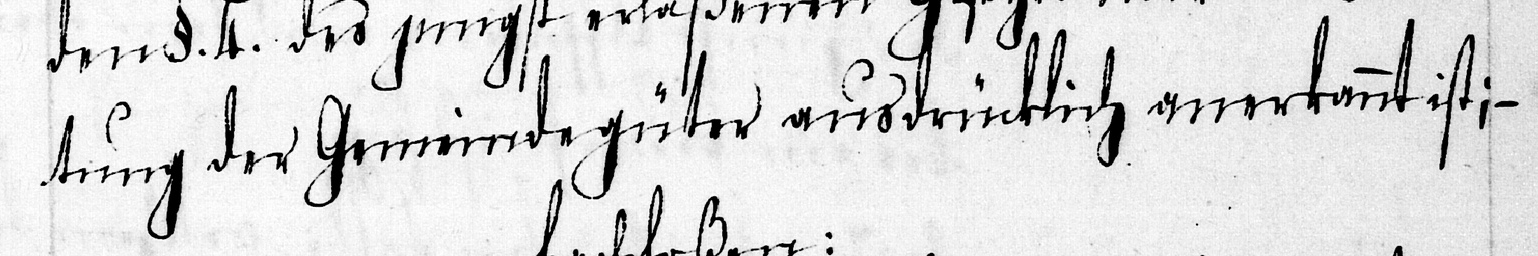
tung der Gemeindegüter ausdrücklich anerkannt ist;
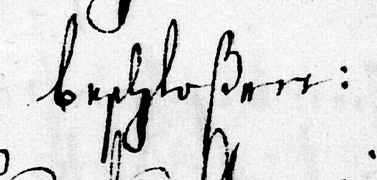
beschloßen:
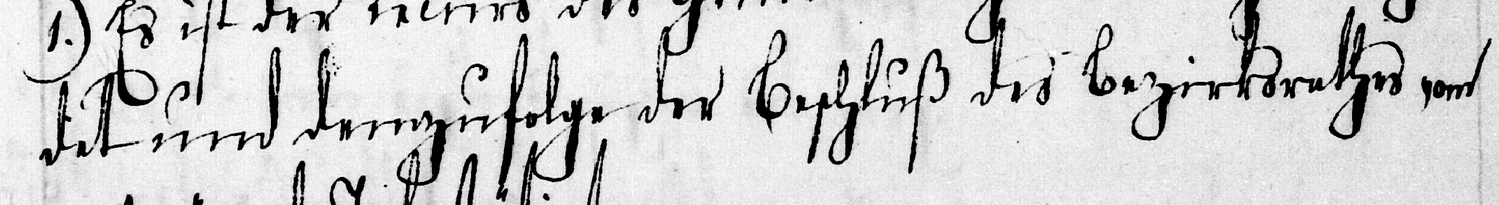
det und demzufolge der Beschluß des Bezirksrathes vom
